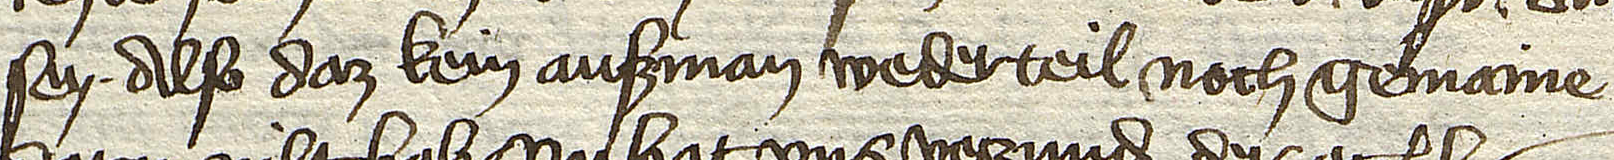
ſey . Alſo daʒ kein auſʒman weder teil noch gemaine
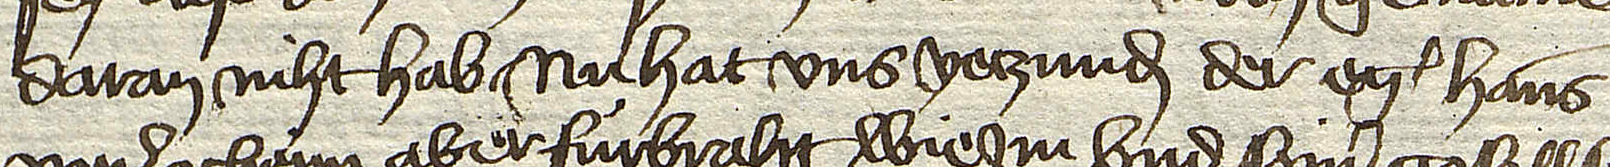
daran niht hab / Nu hat vns yecʒund* der eg* hans*
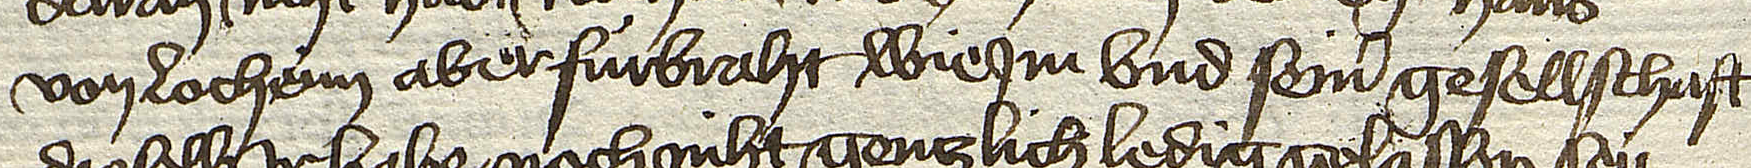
von Locheim aber fürbraht wie Im vnd ſein* geſellſchaft
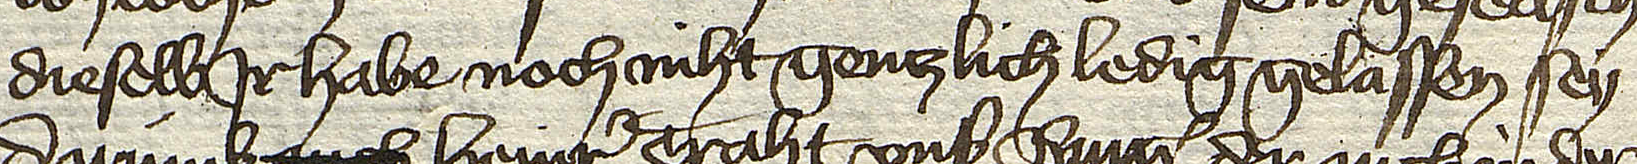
dieſelb Ir habe noch niht gencʒlich ledig gelaſſen ſey
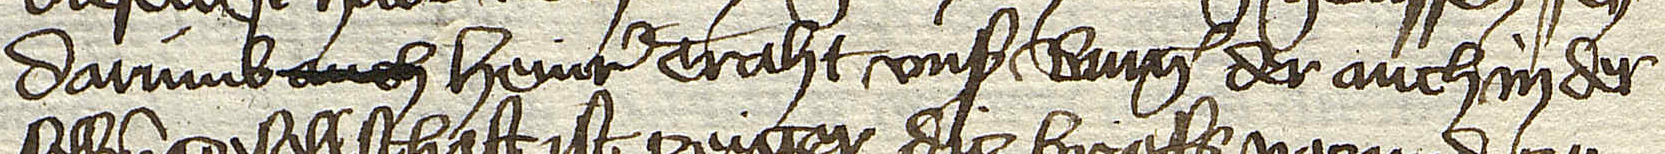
Darümb auch Heinr* Traht vnſ* Burg* der auch in der
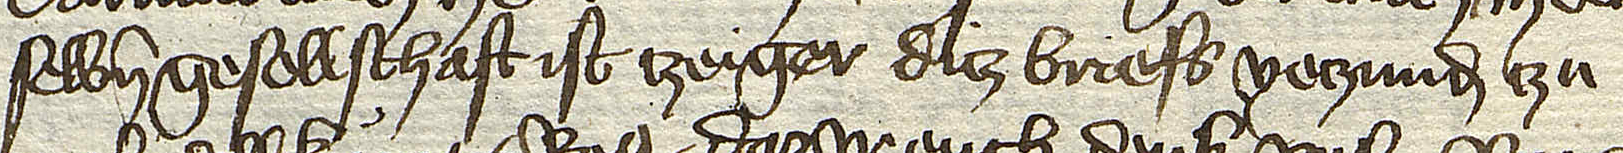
ſelbn* geſellſchaft iſt cʒeiger dicʒ briefs yecʒund* cʒu
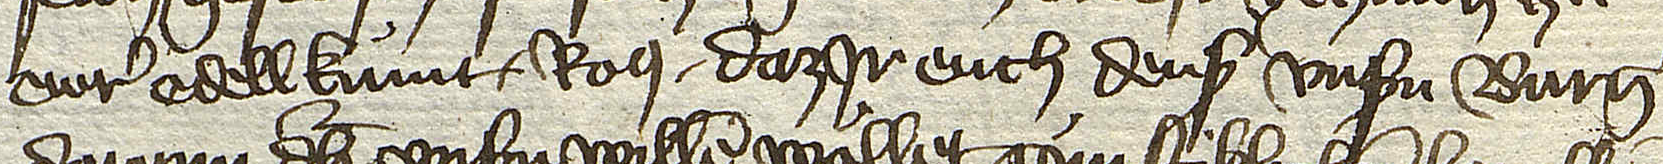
ewr* edell kümt / Ro* / daʒ Ir euch denſ* vnſ*n Burg*
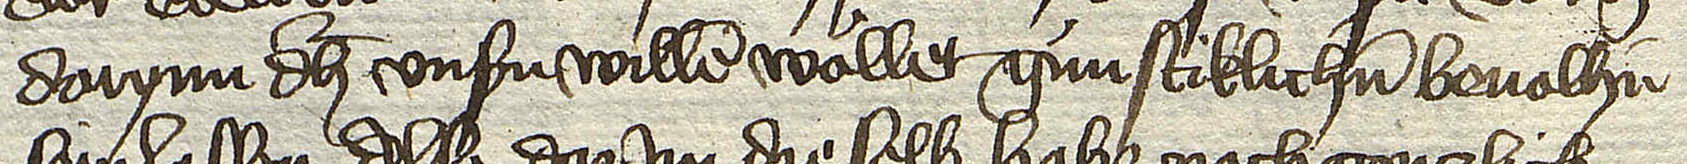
darynn dh* vnſ*n wille* wöllet günſtiklich*n beuolhn*
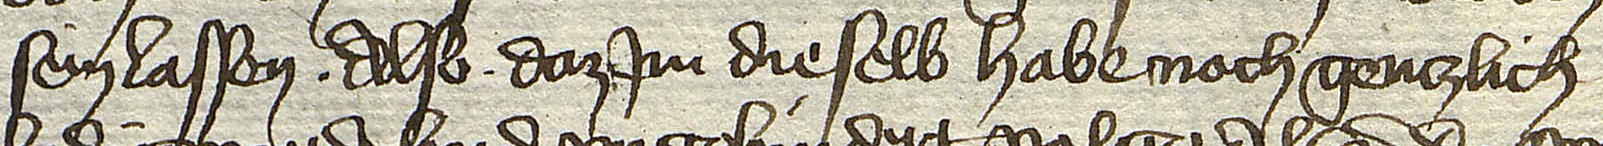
ſein laſſen . Alſo . daʒ Im dieſelb habe noch gencʒlich
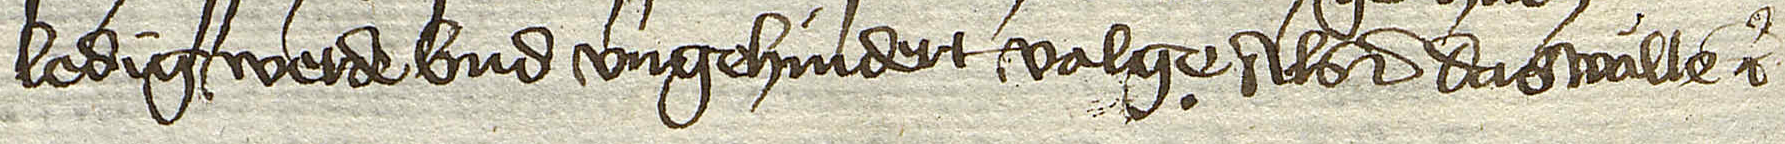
ledig werde vnd vngehindert volge Als ec* das wölle* ec*
